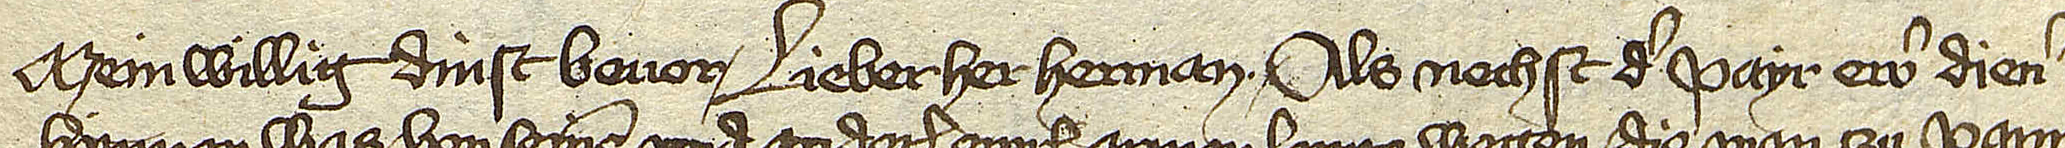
Mein willig dinſt beuor / Lieber her herman . / Als nechſt d* Payr ew* dien*
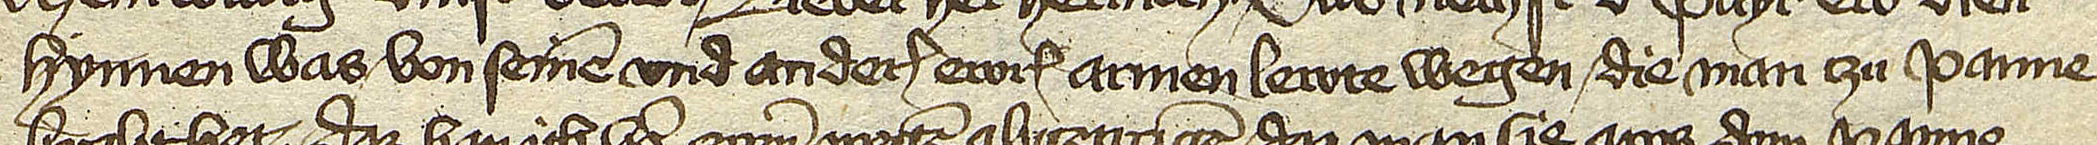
hynnen was von ſeine* vnd ander* ewr* armen lewte wegen / die man cʒu Panne
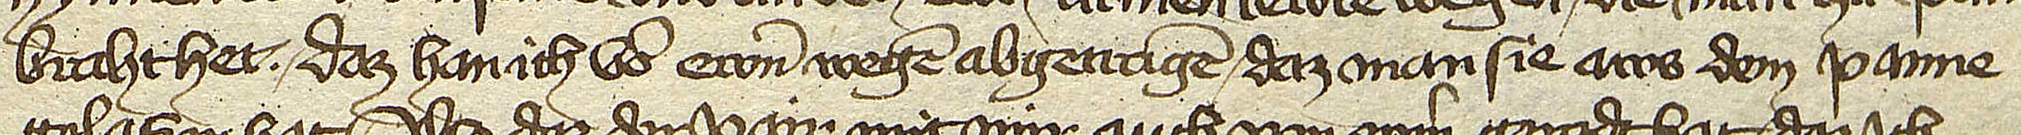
braht het . / daʒ han ich vo* ewn* wege* abgetrage* / daʒ man ſie aws dem Panne
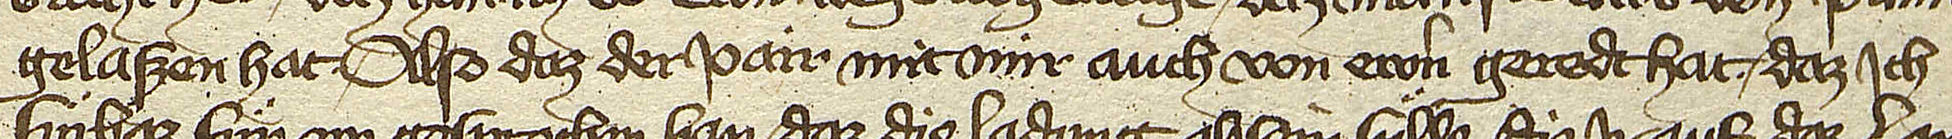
gelaſʒen hat . / Alſo daʒ der Pair mit mir auch von ewn* geredt hat . / daʒ Ich
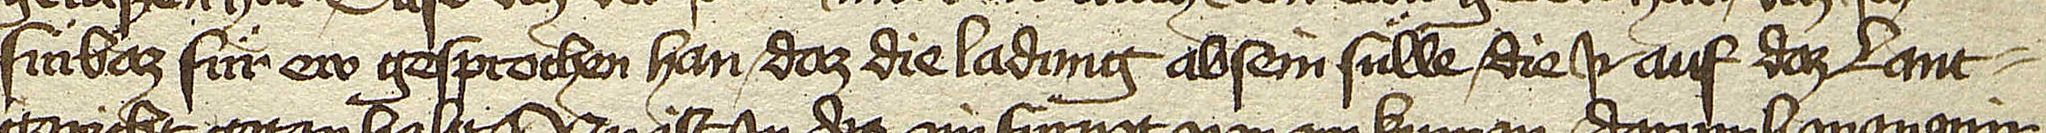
fürbaʒ für ew geſprochen han / daʒ die ladung abſein ſülle / die Ir auf daʒ Lant =
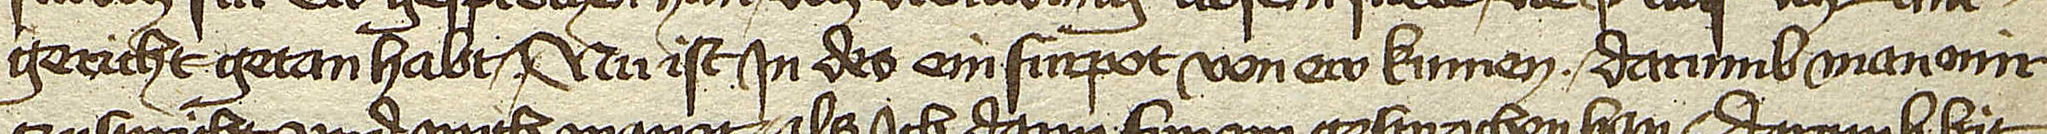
gericht getan habt / . Nu iſt des ein fürpot von ew kumen . / darvmb man mir
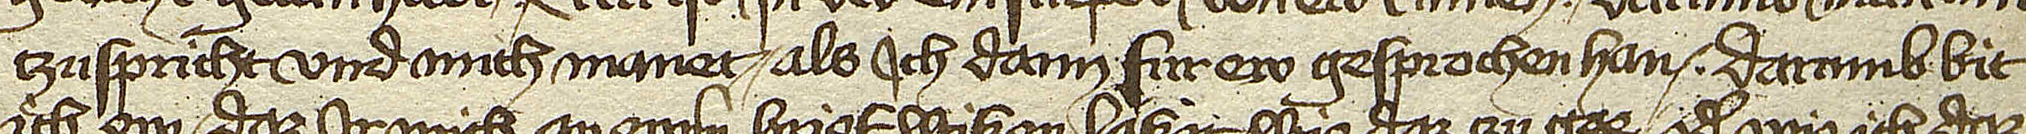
cʒuſpricht vnd mich manet / als Ich dann fur ew geſprochen han / . darvmb bit
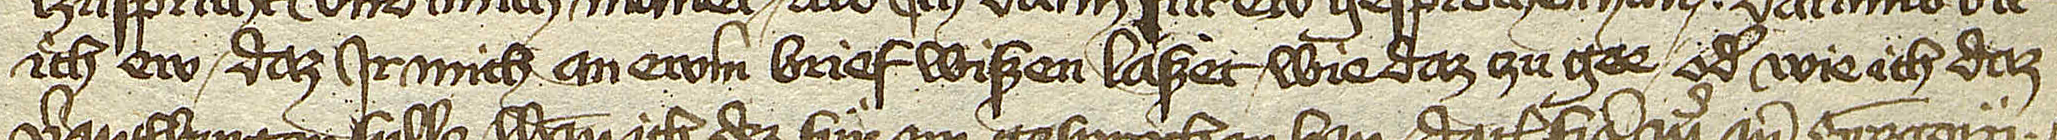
ich ew / daʒ Ir mich an ew*m brief wiſʒen laſʒet / wie daʒ cʒu gee od wie ich daʒ
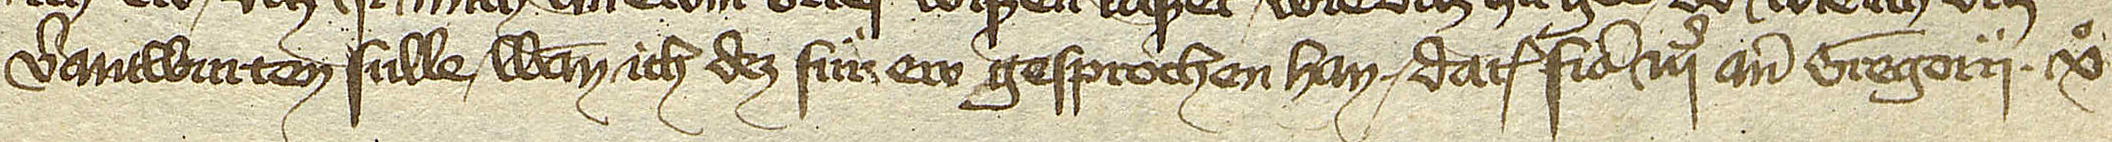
v*antwurten ſulle / wan ich deʒ für ew geſprochen han / dat* fia* iii* an* Gregorii . x*
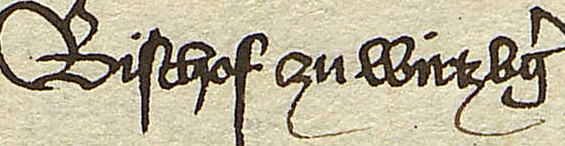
Biſchof cʒu Wirtʒbg*
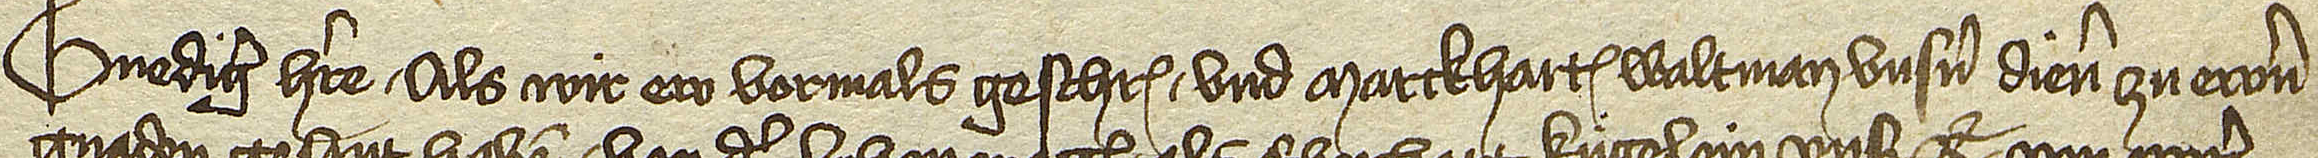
Gnedig* h*re / Als wir ew vormals geſchr* / vnd Marckhart* waltman vnſn* dien* cʒu ewn*
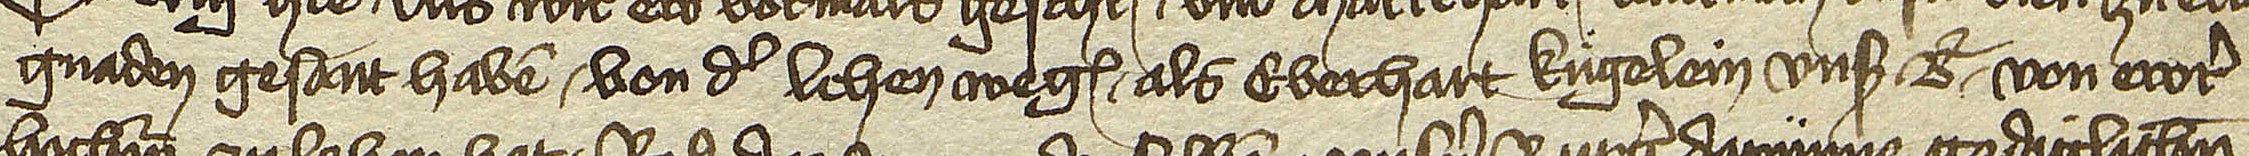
gnaden geſant habe* / von d* lehen weg* / als Eberhart kügelein vnſ* B* / von ewr*
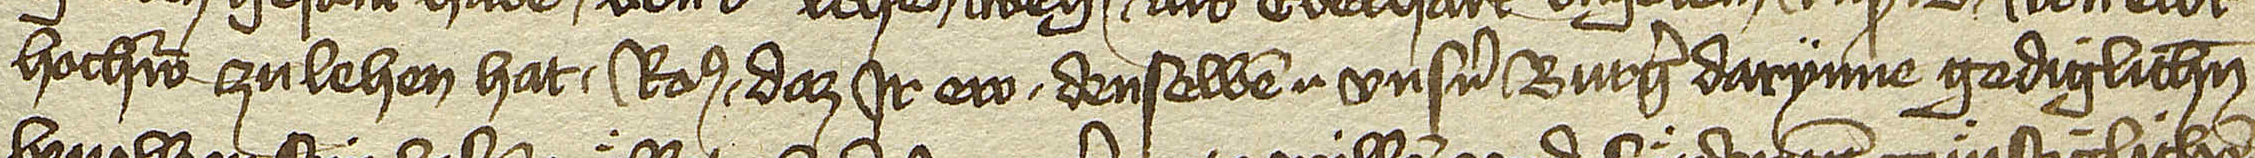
hochw* cʒu lehen hat / Ro* / daʒ Ir ew / denſelbe* ~ vnſn* Burg* darynne gediglichn*
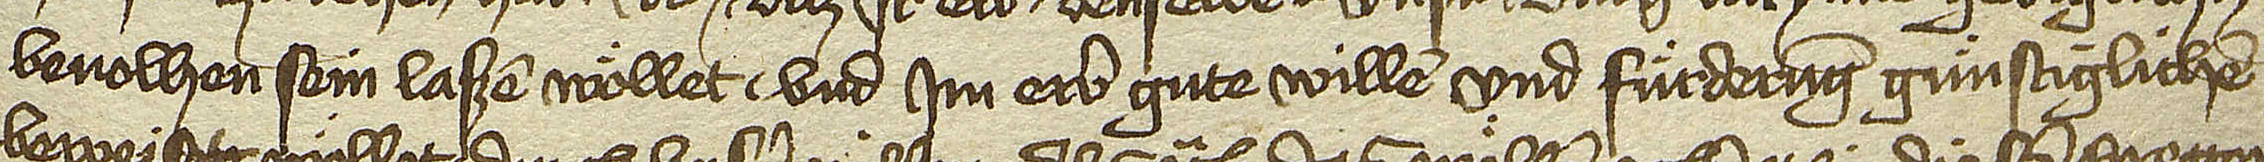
beuolhen ſein laſʒe* wöllet / vnd Im ew* gute wille* vnd fürderug* günſtigliche*
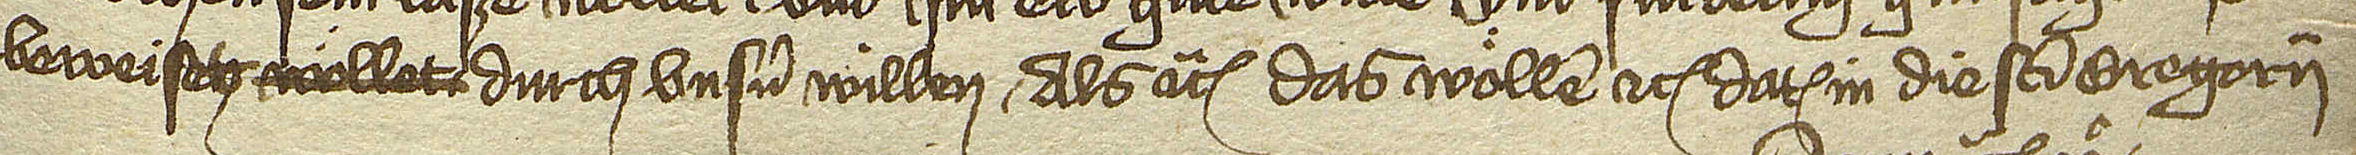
beweiſetn wöllet / durch vnſn* willen / Als ec* das wölle* ec* dat* in die ſci* Gregorii
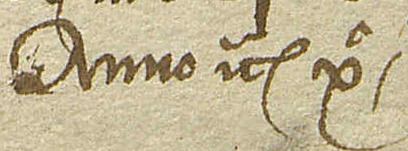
Anno ec* x* /
